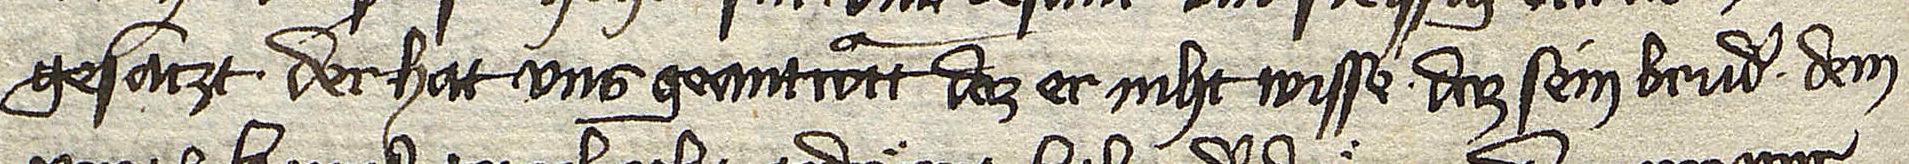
geſacʒt . der hat vns geantw*tt daʒ er niht wiſſe . daʒ ſein brud* . dem
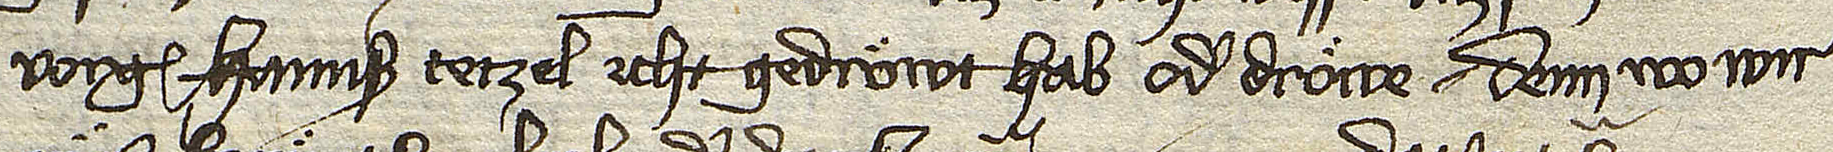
vorg* hannſ* tecʒel icht gedröwt hab od* dröwe / Denn wo wir
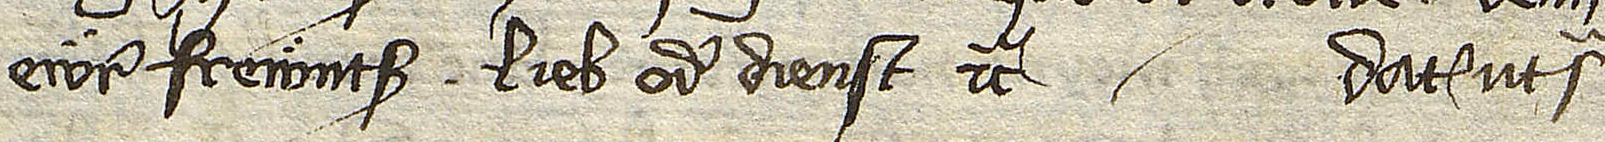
eẅr* freẅntſ* lieb od* dienſt ec* / Dat* ut ſ*
